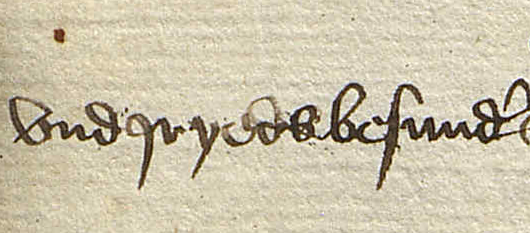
vnd Ir yeds beſund*
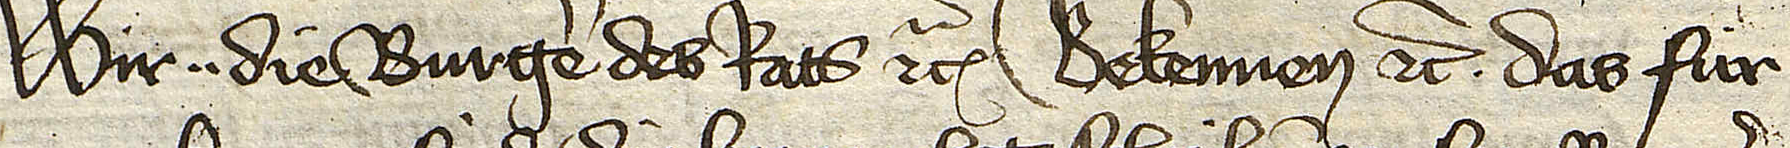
Wir ~ die Burge* des Rats ec* Bekennen ec* . Das für
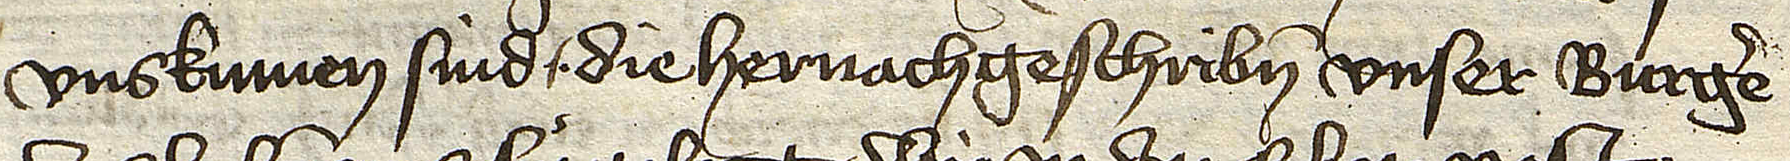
vns kumen ſind / die hernach geſchribn* vnſer Burge*
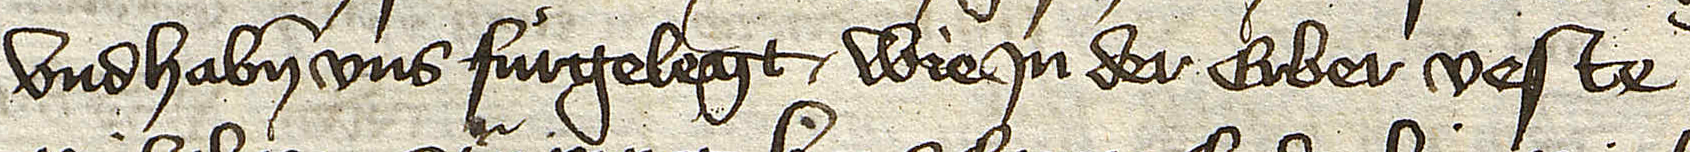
vnd habn* vns fürgelegt / wie In der Erber veſte
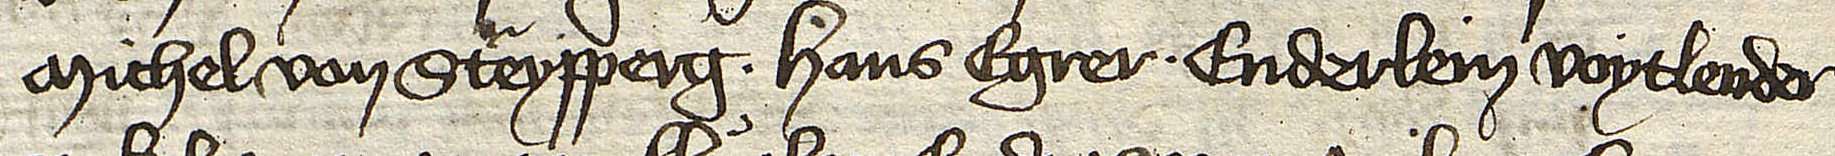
Michel von Steypperg . Hans Egrer . Enderlein voytlender
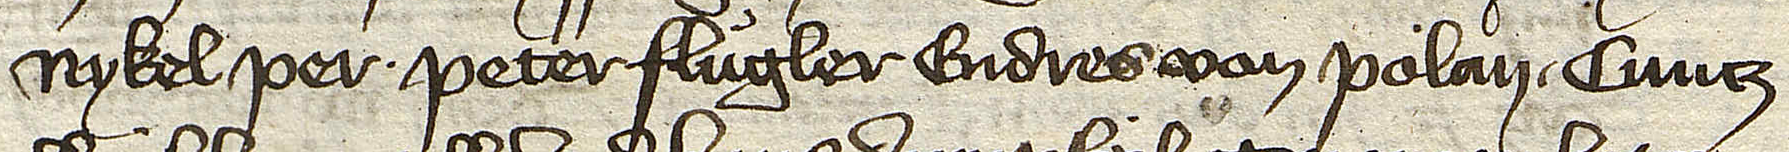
Nykel Per . Peter flügler Endres von Polan / Cuncʒ
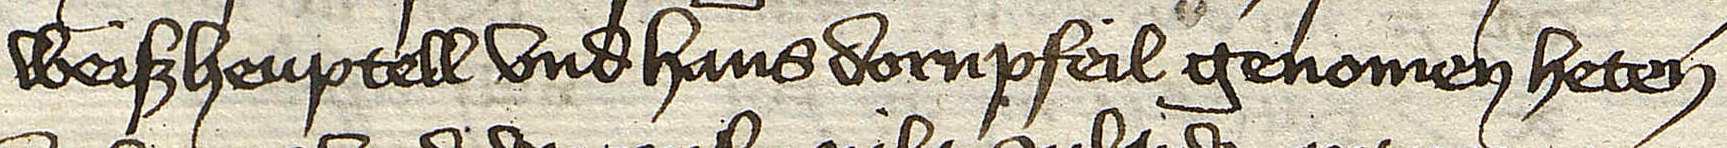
Weiſʒheuptell vnd hans Dornpfeil genomen heten
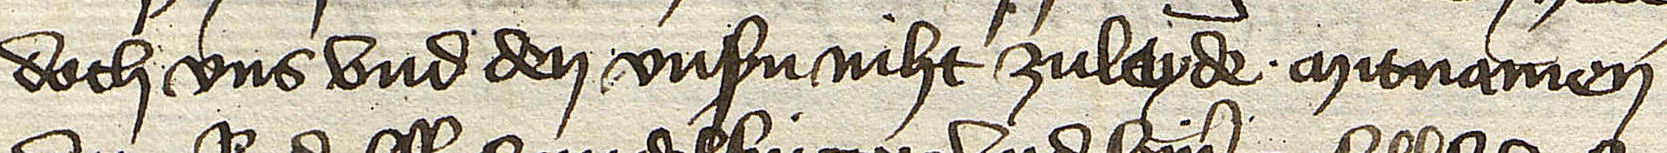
doch vns vnd den vnſ*n niht ʒuleyde . Mitnamen
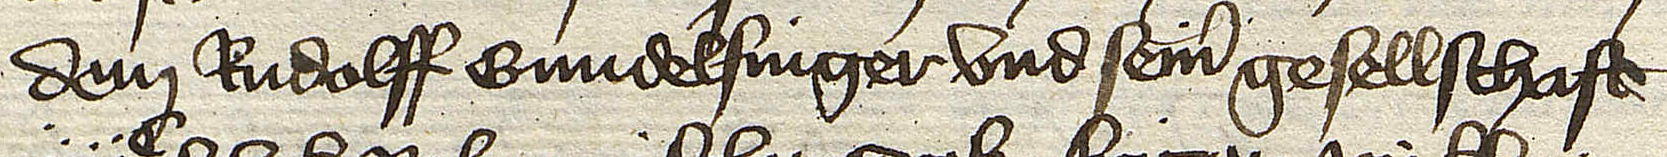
dem Rudolff Gundelfinger vnd ſein* geſellſchaft
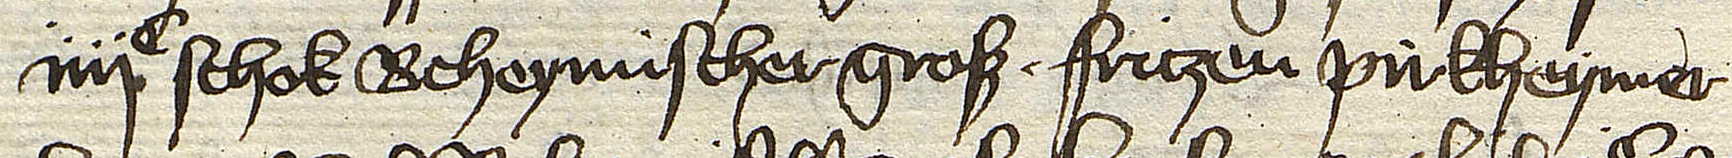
iiii* ſchok Beheymiſcher groſʒ . fricʒen Pirkheymer
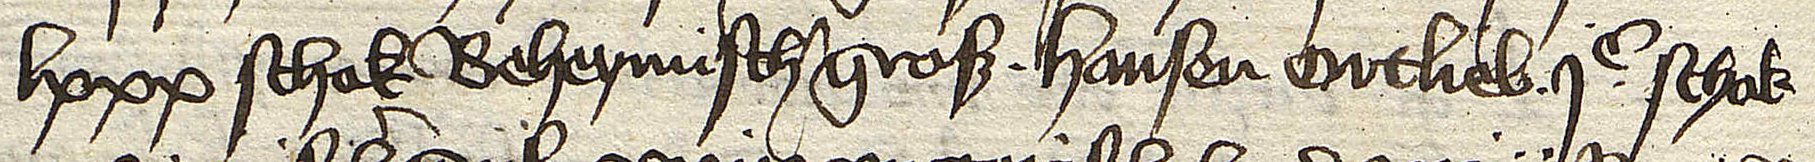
lxxx ſchok Beheymiſch* groſʒ . hanſen Ortlieb i* ſchok
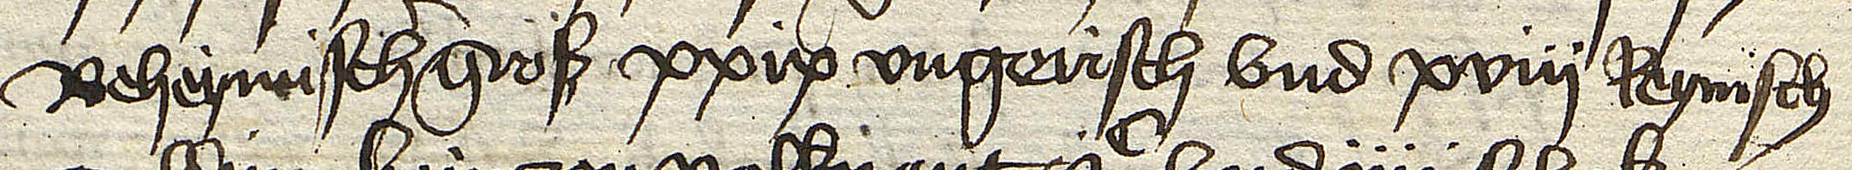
Beheymiſch* gröſʒ xxxix vngeriſch vnd xviii Reyniſch
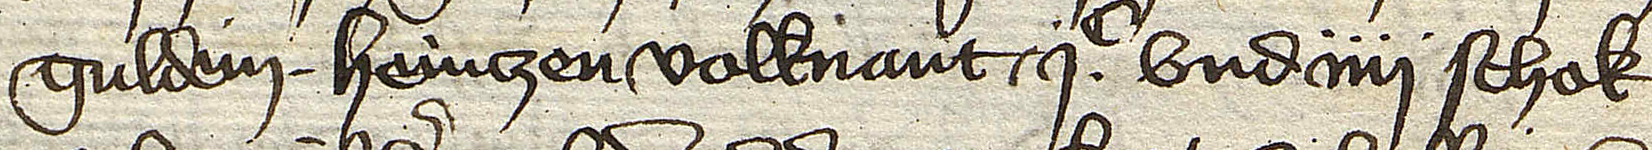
guldlein . heincʒen volknant / i* vnd iiii ſchok
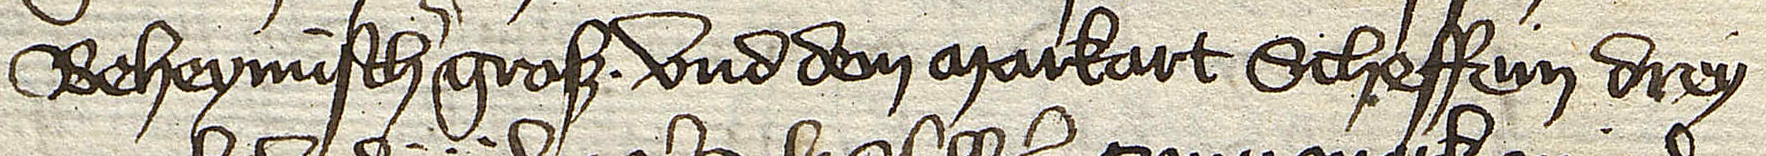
Beheymiſch* groſʒ . Vnd dem Markart Scheffein drey
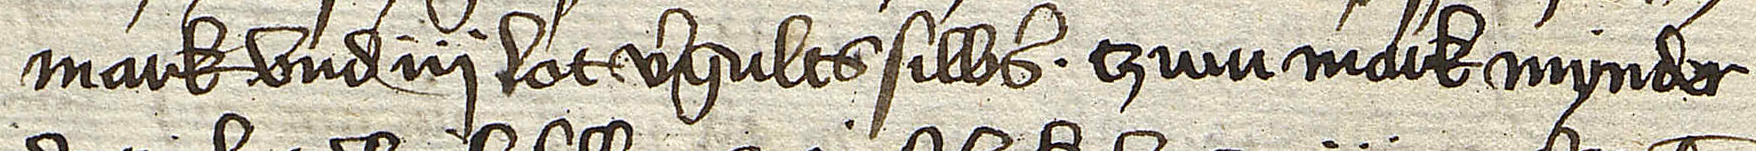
mark vnd iii lot v*gults ſilb*s . cʒwu mark mynder
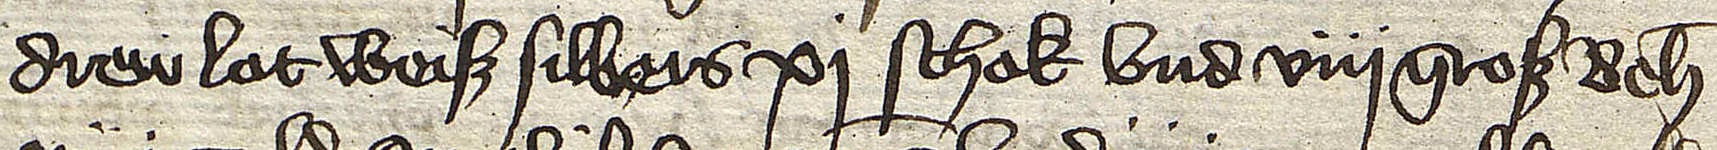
drew lot weiſʒ ſilbers xi ſchok vnd viii groſʒ Beh*
